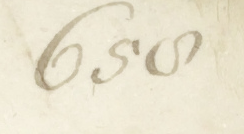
658
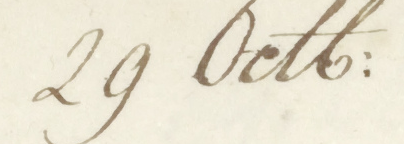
29 Octb:
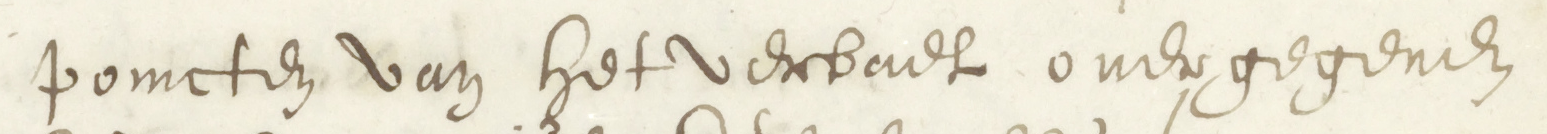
poincten van het verbael ouergegeven
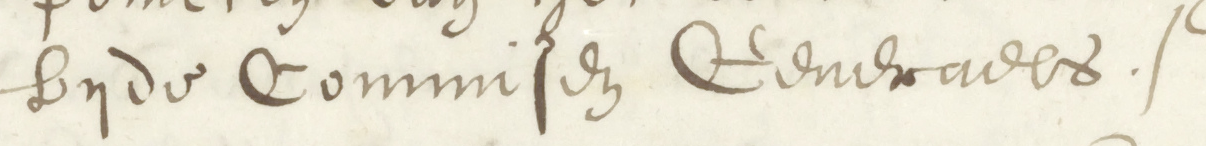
byde Commisen Generaels.
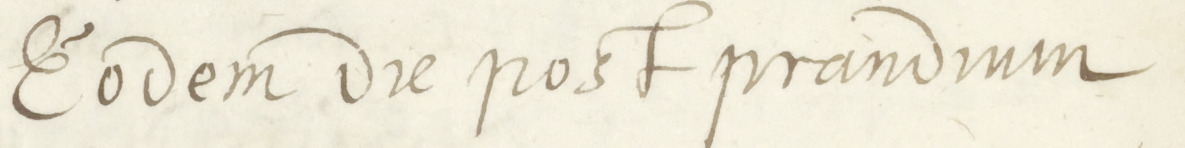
Eodem die post prandium
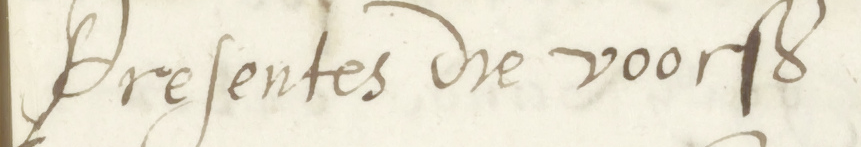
Presentes die voors
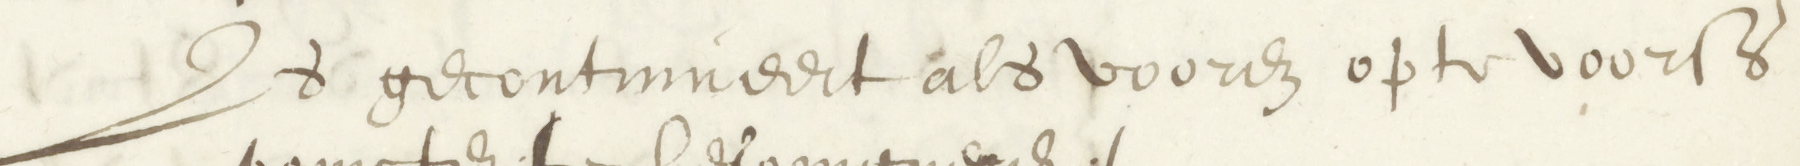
Is gecontinueert als vooren opte voors
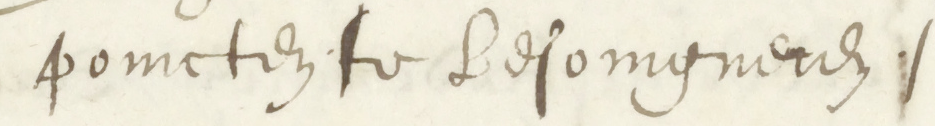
poincten te Resoingneren.
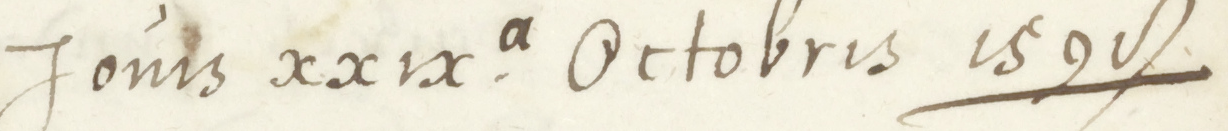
Jouis xxixa Octobris 1598
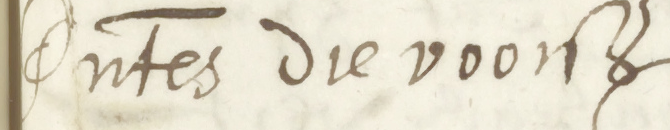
Pntes die voors
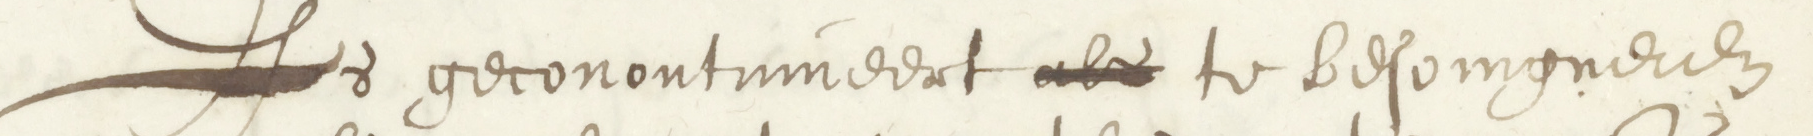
Is geconontinueert als te besoingneren
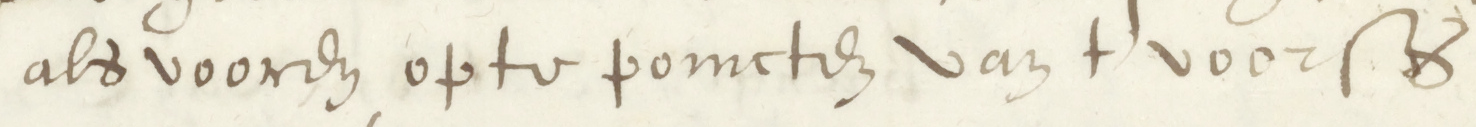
als vooren opte poincten van t'voors
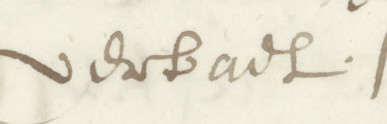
verbael.
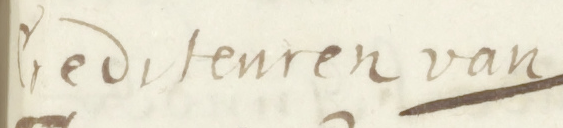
Crediteuren van
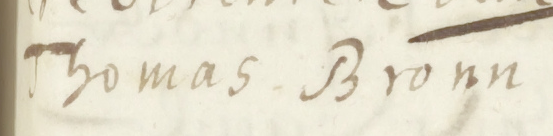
Thomas Broun
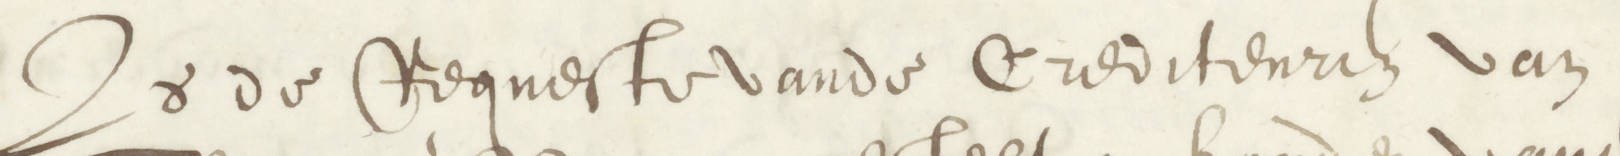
Is de Requeste vande Crediteuren van
